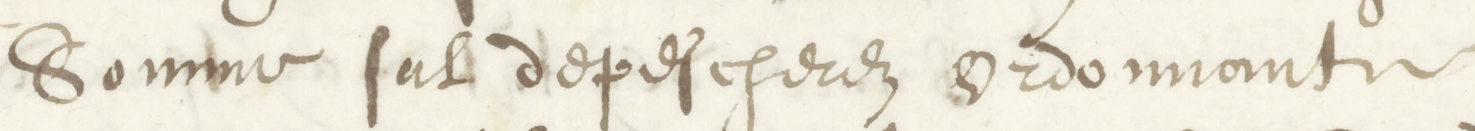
Somme sal depescheren ordonnantie
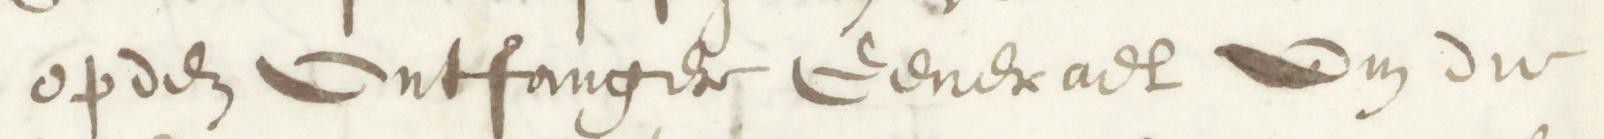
opden Ontfanger Generael om die
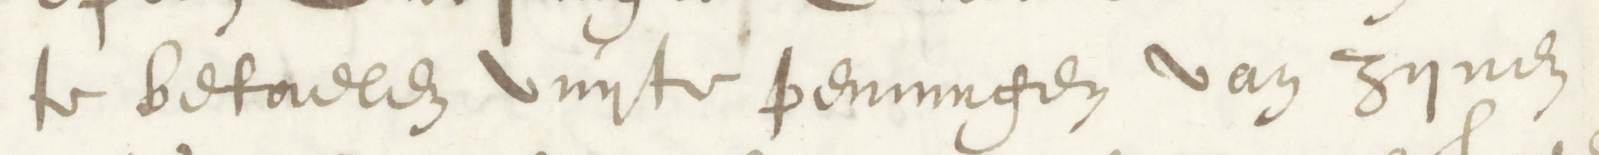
te betaelen vuyte penningen van zynen
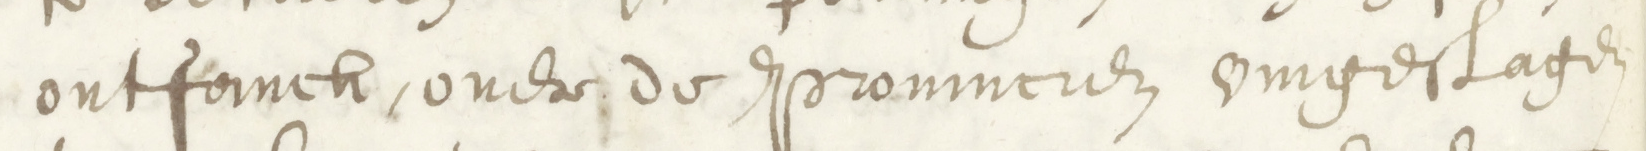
ontfanck, ouer de prouincien omgeslagen
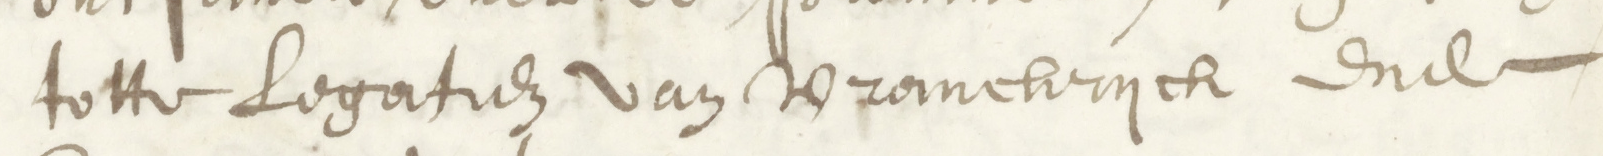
totte Legatien van Vranckryck ende
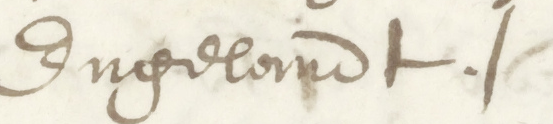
Engelandt.
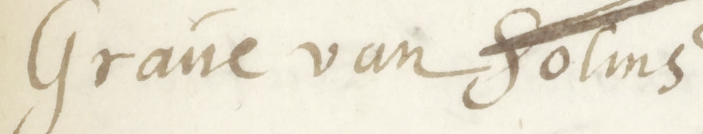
Graue van Solms
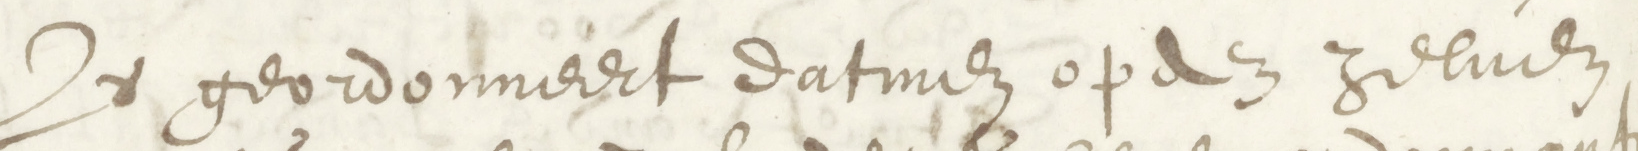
Is geordonneert datmen opden zeluen
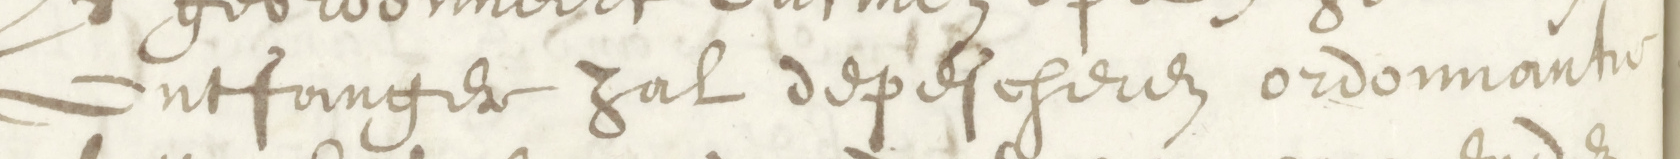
Ontfanger zal depescheren ordonnantie
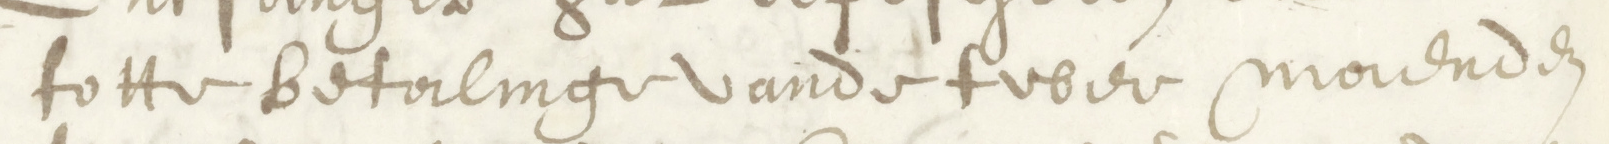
totte betalinge vande twee maenden
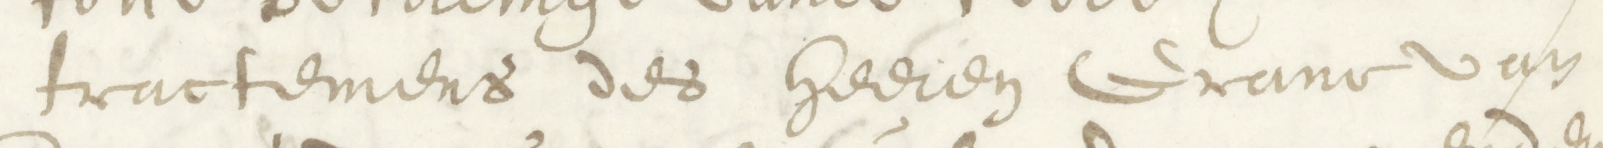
tractemens des heeren Graue van
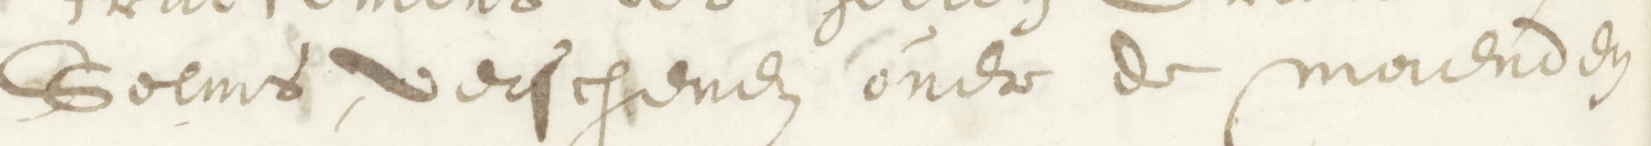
Solms, verschenen ouer de maenden
